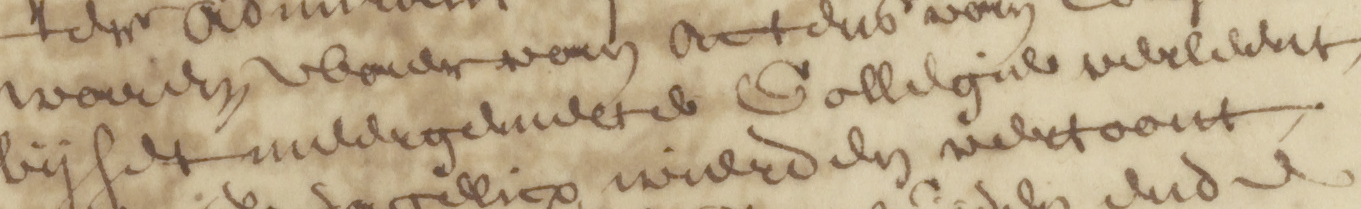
bij het meergemelte Collegie verleent,
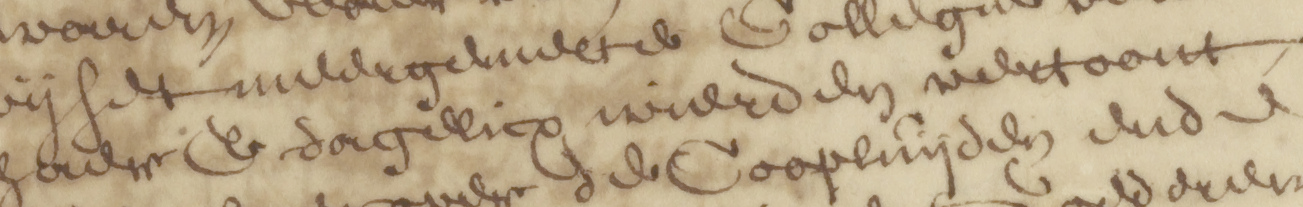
haer E. dagelicx wierden vertoont,
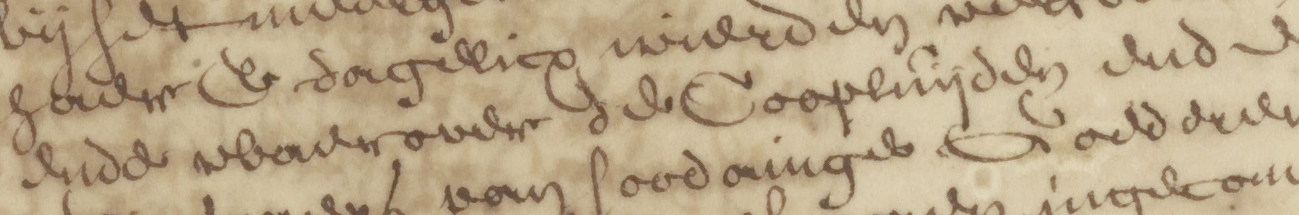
ende waerover de Coopluijden ende
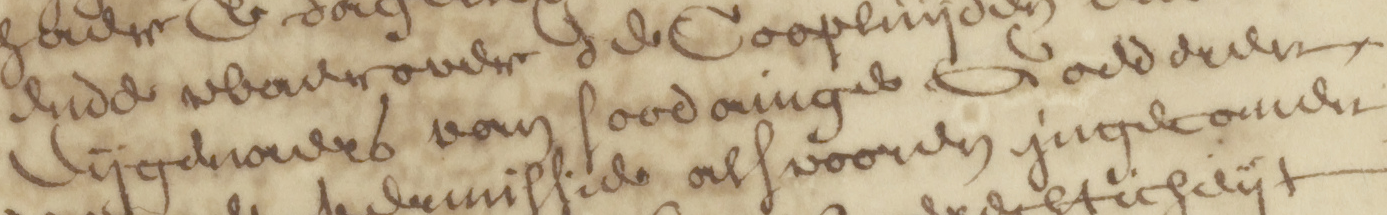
Eijgenaers van soodanige Goederen,
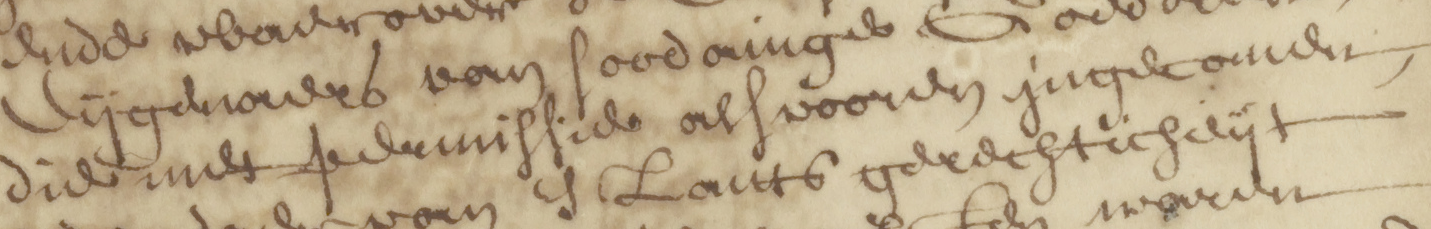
die met permissie alsvooren ingecomen,
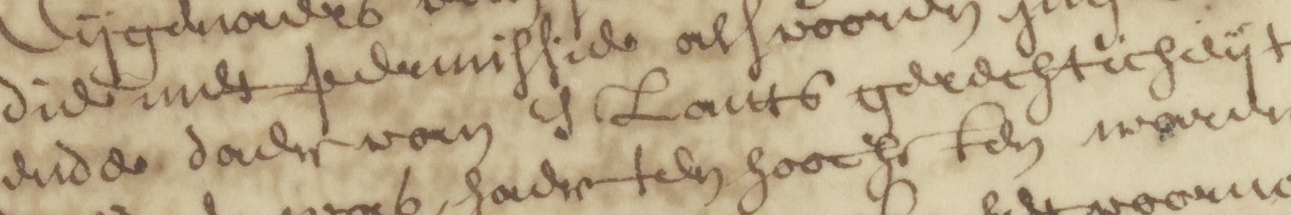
ende daer van ‛s Lants gerechticheijt
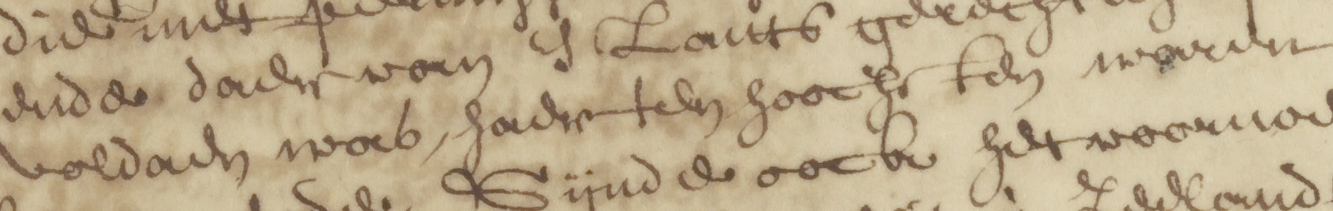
voldaen was, haer ten hoochsten waren
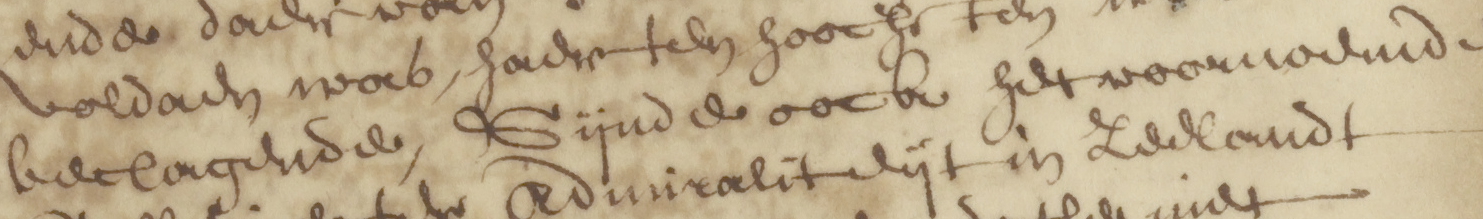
beclagende. Sijnde oock het voornoemde
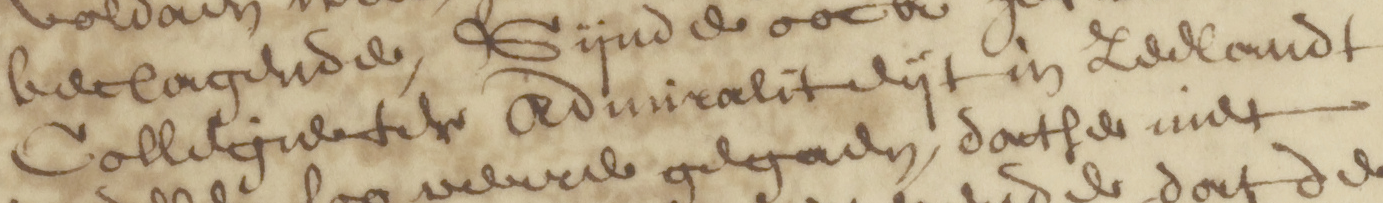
Collegie ter Admiraliteijt in Zeelandt
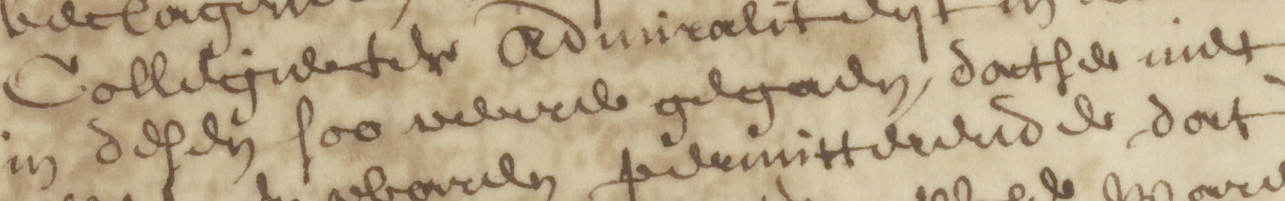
in desen soo verre gegaen, datse niet
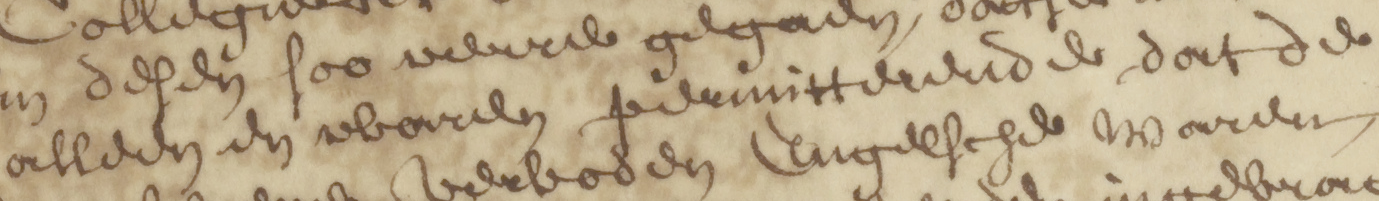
alleen en waren permitterende, dat de
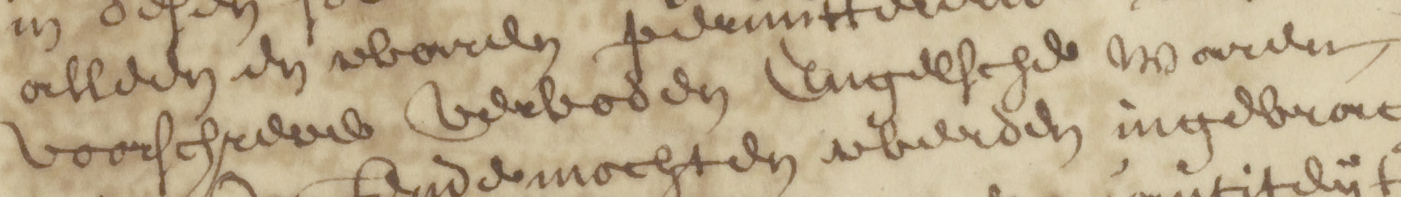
voorschreve verboden Engelsche Waren,
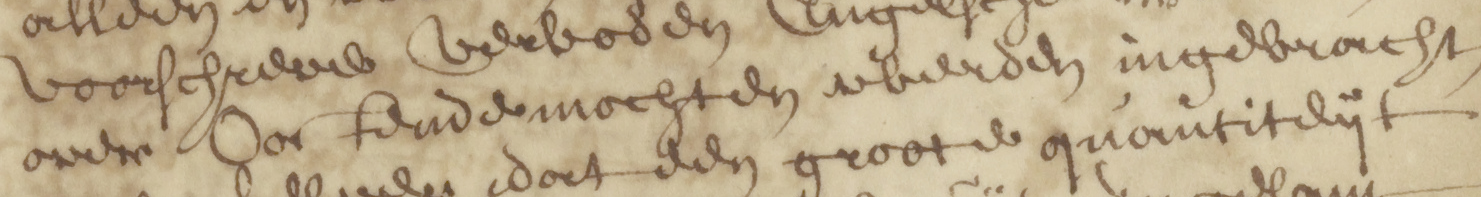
over Oostende mochten werden ingebracht,
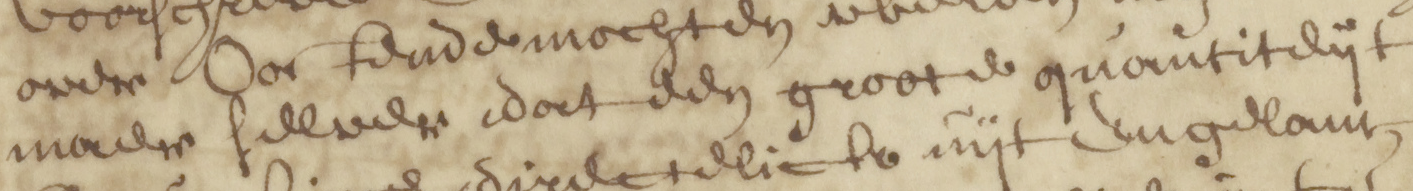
maer selver, dat den groote quantiteijt
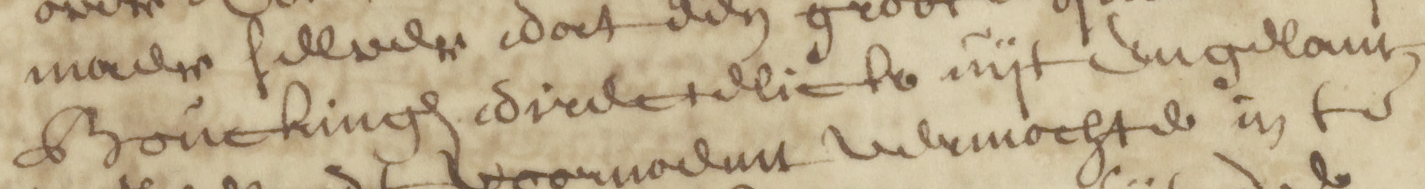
Bouckingh, directelick uijt Engelant,
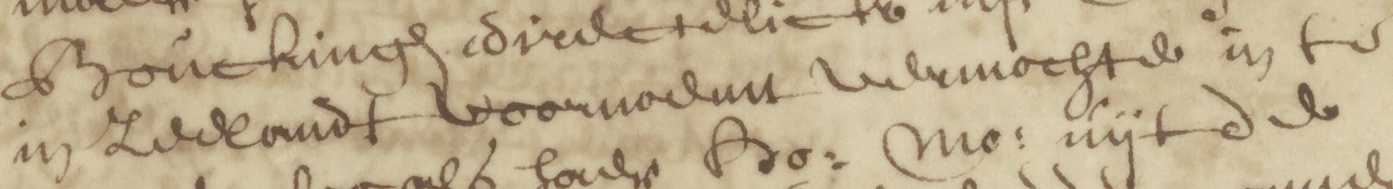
in Zeelandt voornoemt vermochte in te
